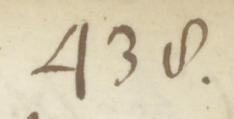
438.
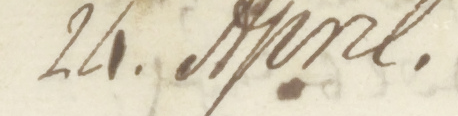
24. April.
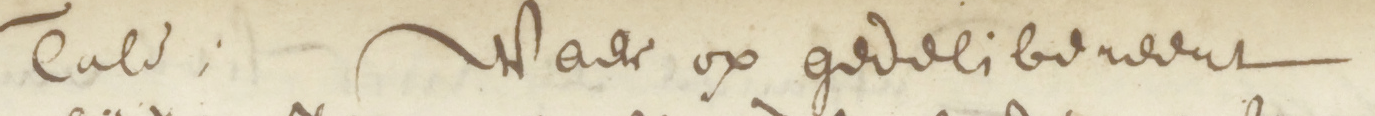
Tale. Waer op gedelibereert
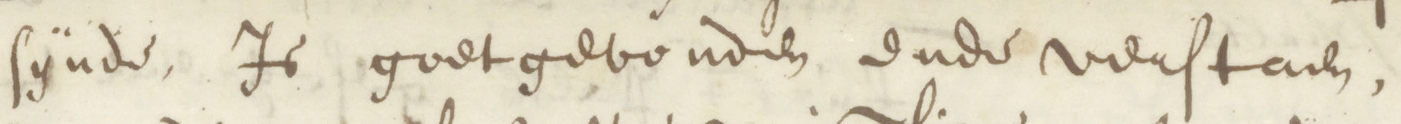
sijnde, is goetgevonden ende verstaen,
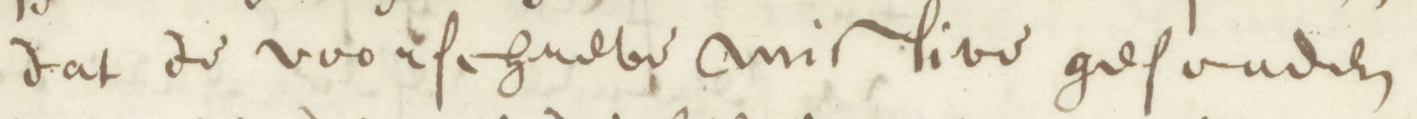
dat de voorschreve missive gesonden
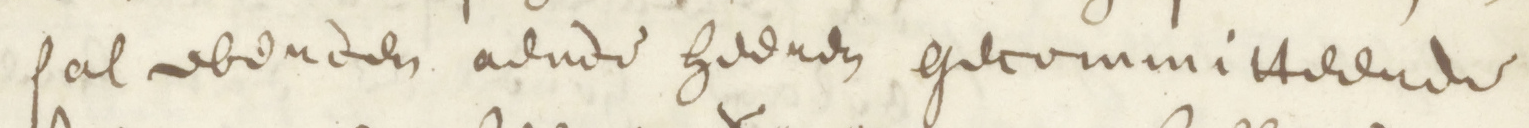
sal werden aende heeren gecommitteerde
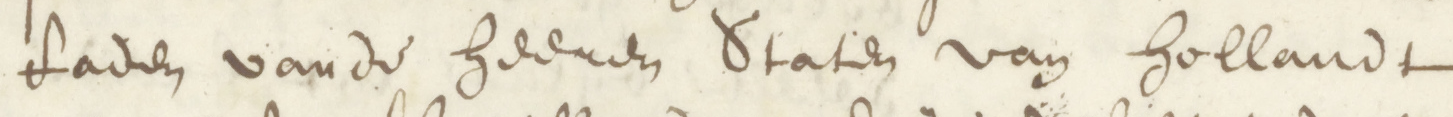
Raden vande heeren Staten van hollandt
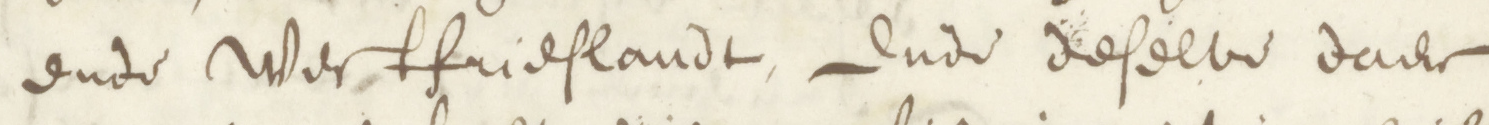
ende Westfrieslandt, ende deselve daer
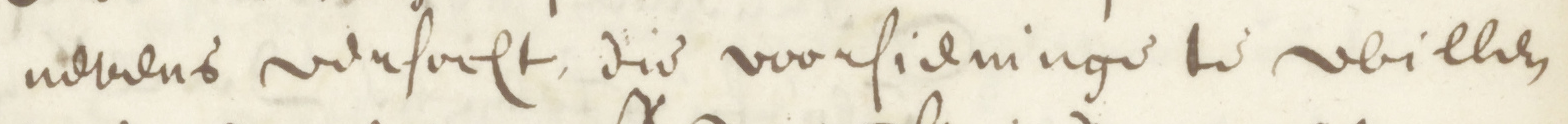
nevens versocht, die voorsieninge te willen
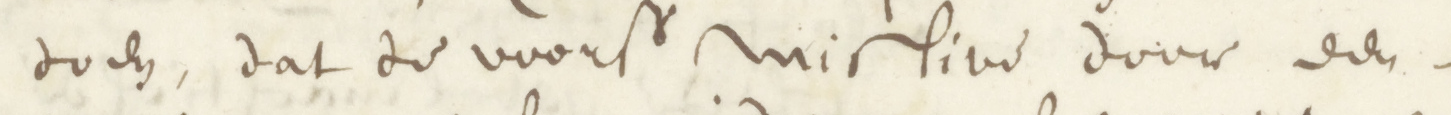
doen, dat de voors missive door een
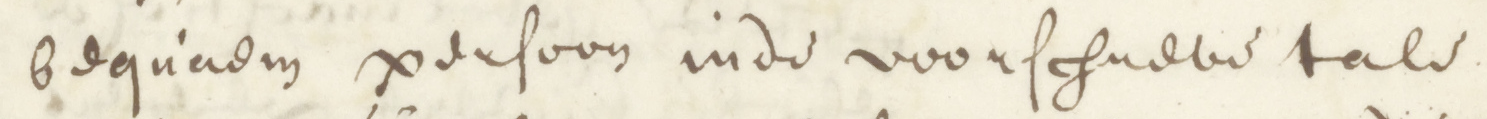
bequaem persoon inde voorschreve tale
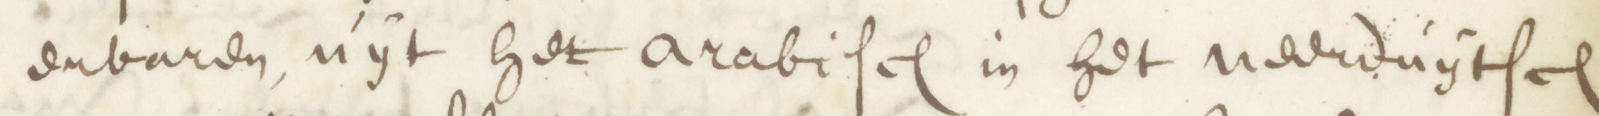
ervaren, uijt het arabisch in het neerduijtsch
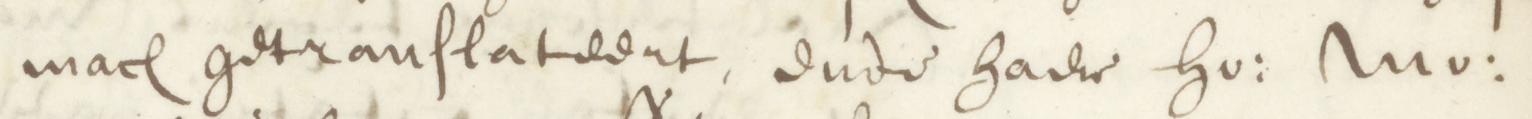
mach getranslateert, ende haer ho:Mo:
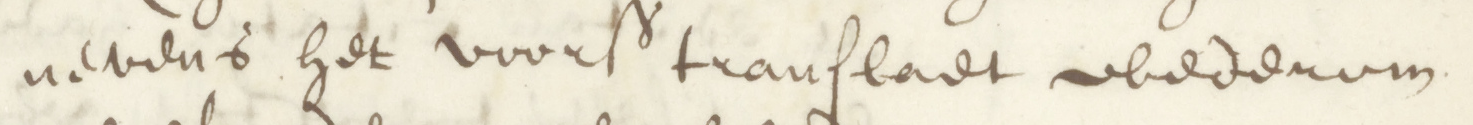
nevens het voors translaet wederom
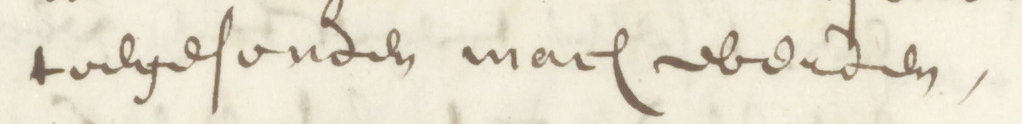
toegesonden mach werden.
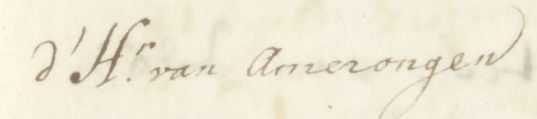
d'Hr. van Amerongen
